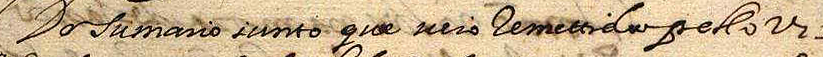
Do Sumario iunto que ueio Remettido pello Vi
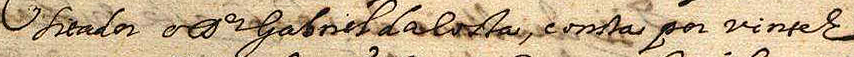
sitador o Dr Gabriel da Costa, consta por vinte E
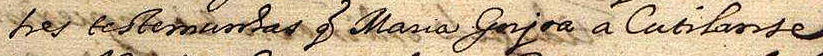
tres testemunhas q̄ Maria Gorjoa a Cutilante
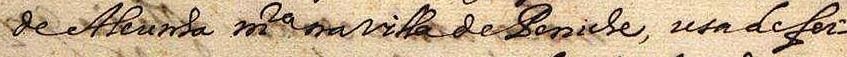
de Alcunha mra na villa de Peniche, usa de fei
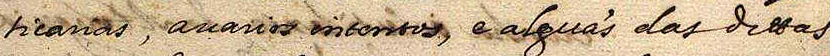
tiçarias, a uarios intentos, e alguās das dittas
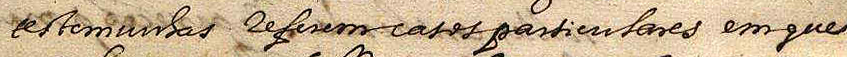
testemunhas Referem casos particulares em que
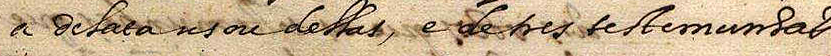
a delata usou dellas, e de tres testemunhas
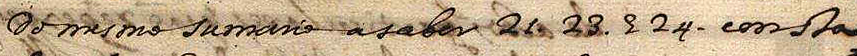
do mesmo sumario a saber 21. 23. E 24 consta
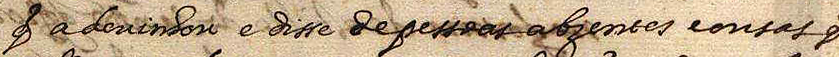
q̄ adeuinhou e disse de pessoas abzentes cousas q̄
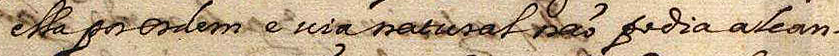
ella por ordem e uia natural naõ podia alcan
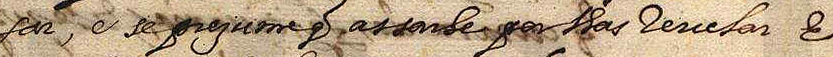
sar, e se prezume q̄ as soube por lhas Reuelar E
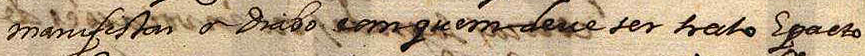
manifestar o Diabo com quem deue ter trato E pacto
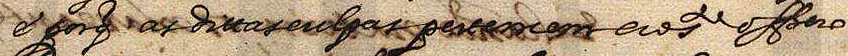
e porq̄ as dittas culpas pertencem ao sto officio
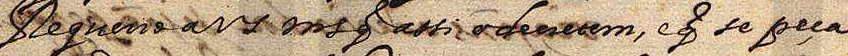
Requeiro a Vs ms q̄ assi o decretem, e q̄ se peça
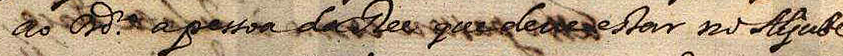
ao Ord.ro a pessoa da Ree que deue estar no Aljube
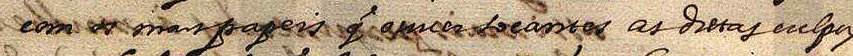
com os mais papeis q̄ tiuer tocantes as dittas culpas
